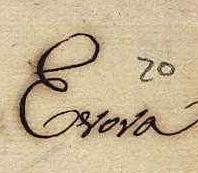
Evora
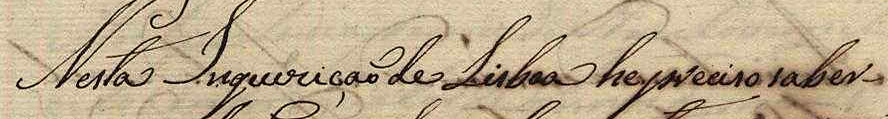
Nesta Inquiziçaõ de Lisboa he preciso saber
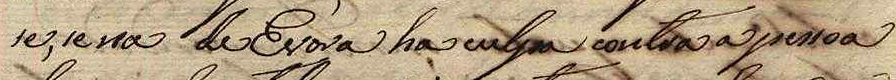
se, se na de Evora ha culpa contra a pessoa
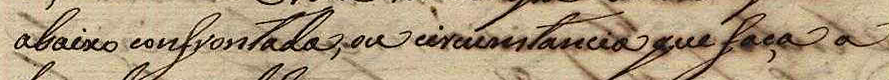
abaixo confrontada, ou circunstancia que faça a
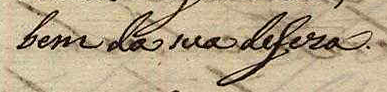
bem da sua defeza.
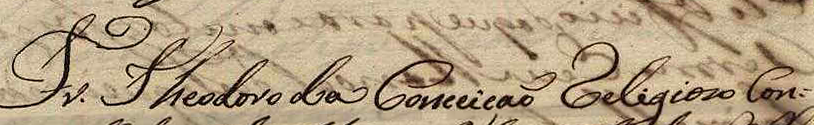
Fr. Theodoro da Conceiçaõ Religiozo Con
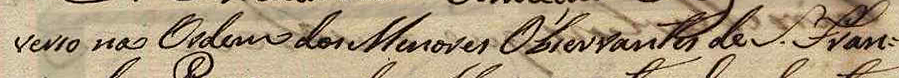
verso na Ordem dos Menores Observantes de S. Fran
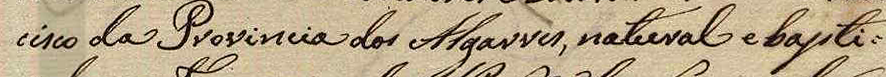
cisco da Provincia dos Algarves, natural e bapti
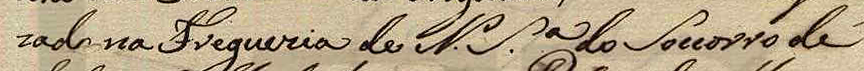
zado na Freguezia de N. S.a do Socorro de
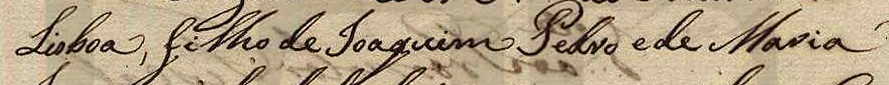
Lisboa, filho de Ioaquim Pedro, e de Maria
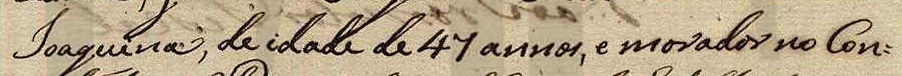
Ioaquina, de idade de 47 annos, e morador no Con
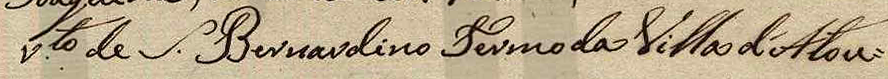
v.to de S. Bernardino Termo da Villa d'Atou
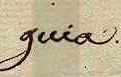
guia.
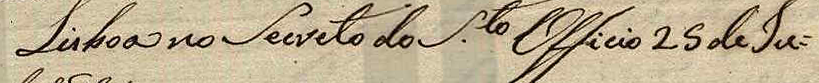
Lisboa no Secreto do S.to Officio 25 de Iu
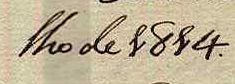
lho de 1814.
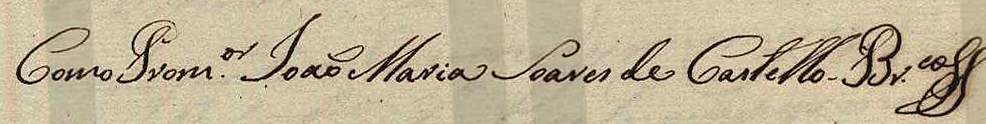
Como Prom.or Ioaõ Maria Soares de Castello-Br.co
